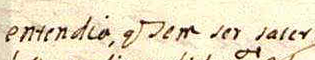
entendia, q̄ sem ser sacer
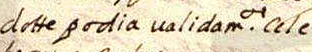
dotte podia ualidamte. cele
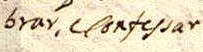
brar, e confessar.
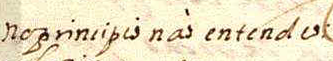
no principio naõ entendeo
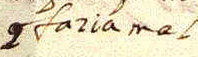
q̄ fazia mal.
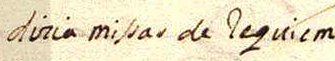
dizia missas de Requiem
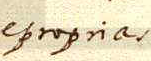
e proprias.
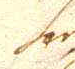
Sor,
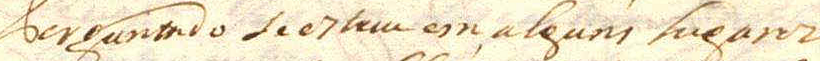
Perguntado se esteue em alguns̄ lugares
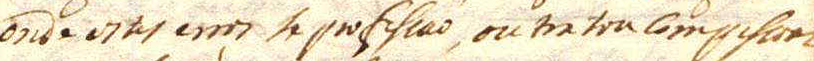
onde estes erros se prosessaõ, ou tratou com pessoas
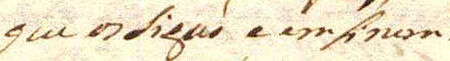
que os digaõ e emsinem.
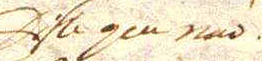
Disse que naõ.
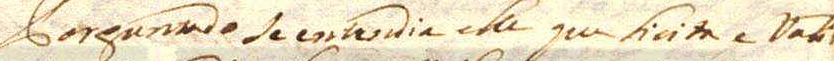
Perguntado se entendia elle que licita, e vali_
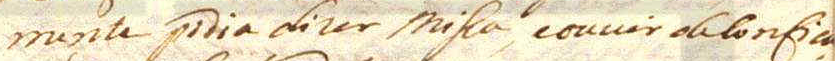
mente podia dizer missa, e ouuir de confiç_
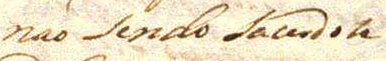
naõ sendo sacerdote
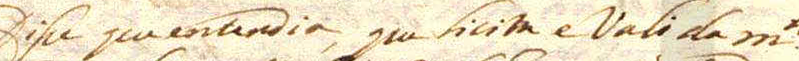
Disse que entendia, que licita e validamte.
